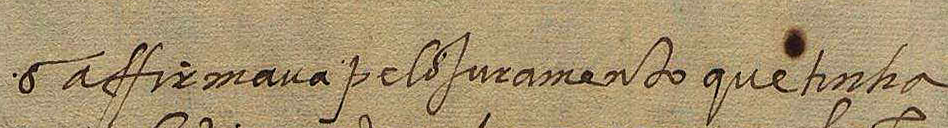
o affirmaua pelo Juramento que tinha
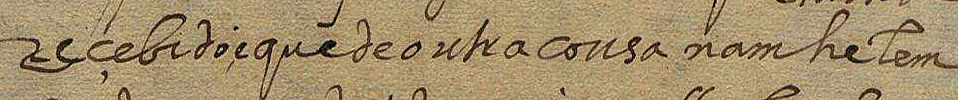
recebido, e que de outra cousa nam he lem
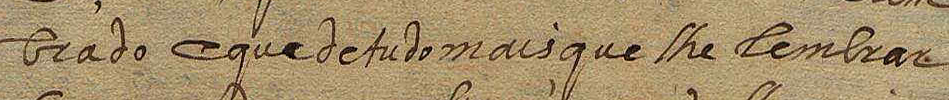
brado e que de tudo mais que lhe lembrar
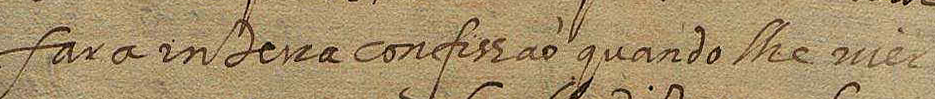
fara inteira confissaõ quando lhe uier
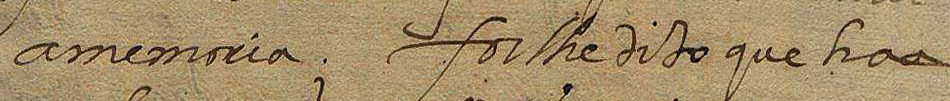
a memoria. foilhe dito que haa
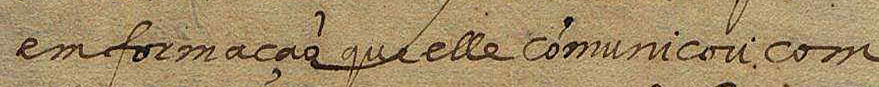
emformaçaõ que elle cōmunicou com
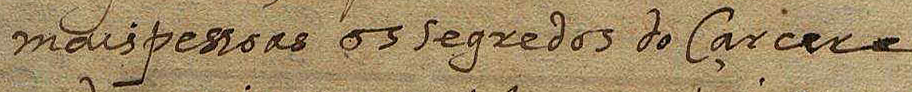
mais pessoas os segredos do Carcere
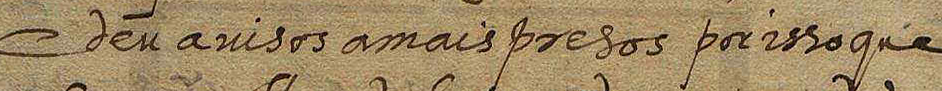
e deu auisos a mais presos por isso que
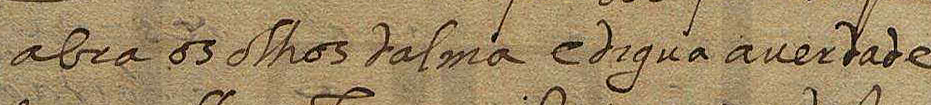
abra os olhos dalma e digua a uerdade
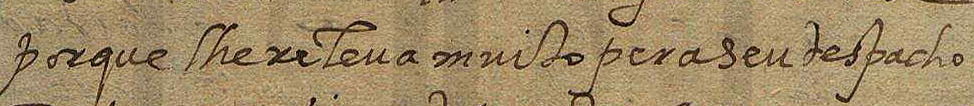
porque lhe releua muito pera seu despacho
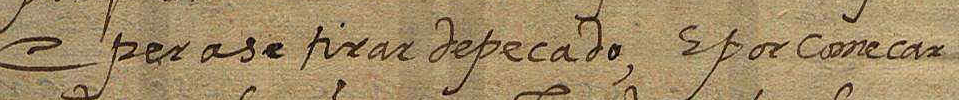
e per asi tirar de pecado, E por começar
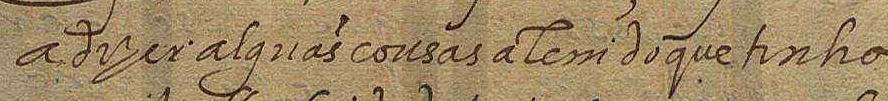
a dizer alguas̄ cousas alem do que tinha
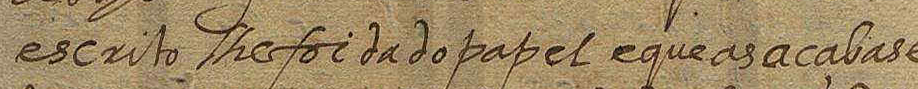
escrito lhe foi dado papel e que as acabase
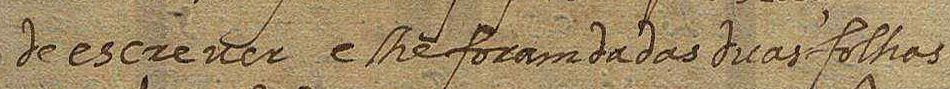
de escreuer e lhe foram dadas duas folhas
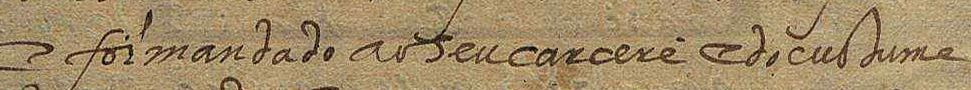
e foi mandado ao seu carcere e do custume
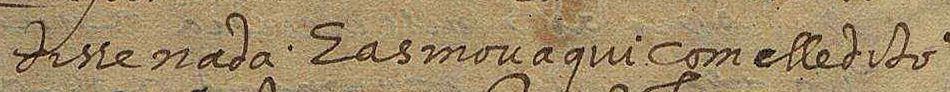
disse nada E asinou aqui com elle dito
